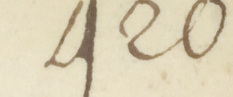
420
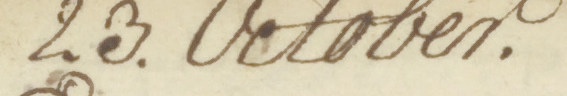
23. Ooctober.
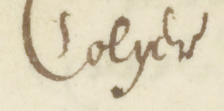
Colyer
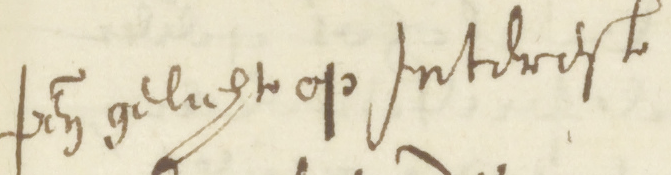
pen gelicht op Interest
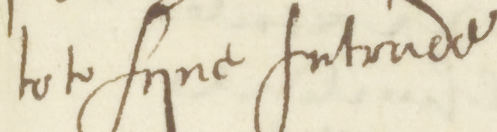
tot syne intrede
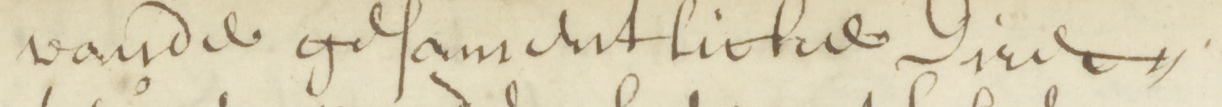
vande gesamentlicke Direc„
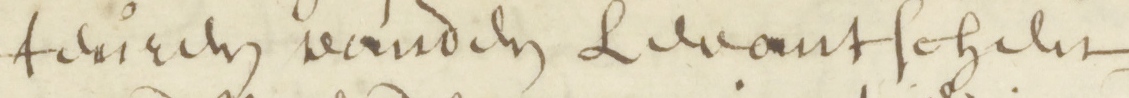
teuren vanden Levantschen
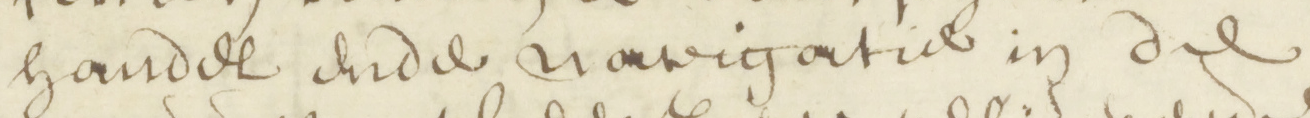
handel ende navigatie in de
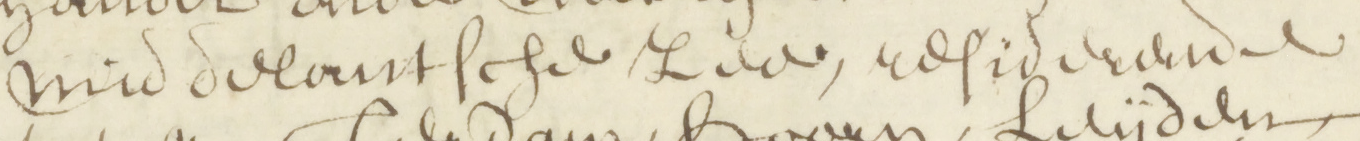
middelantsche Zee, residerende
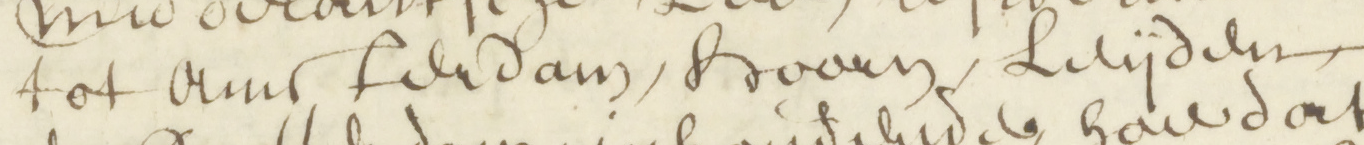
tot Amsterdam, Hoorn, Leijden
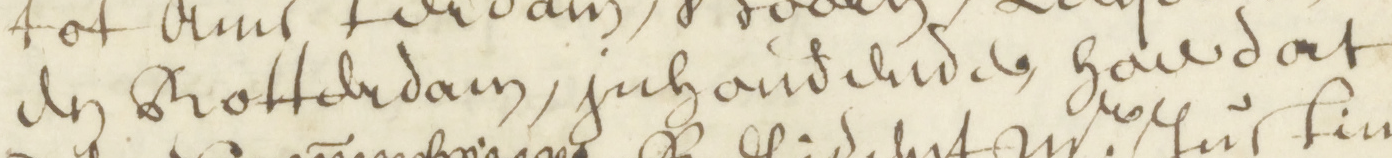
en Rotterdam, inhoudende, hoe dat
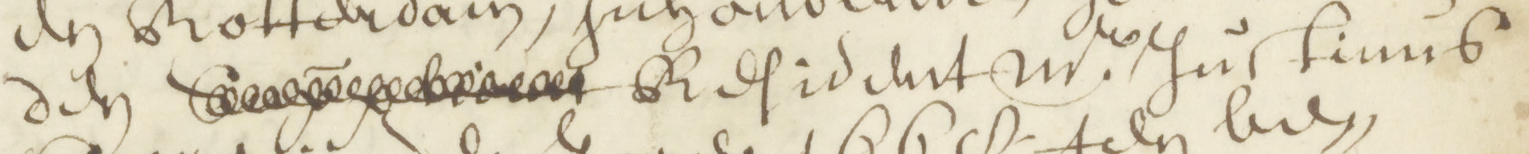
den Suppliant Resident Mr. Justinus
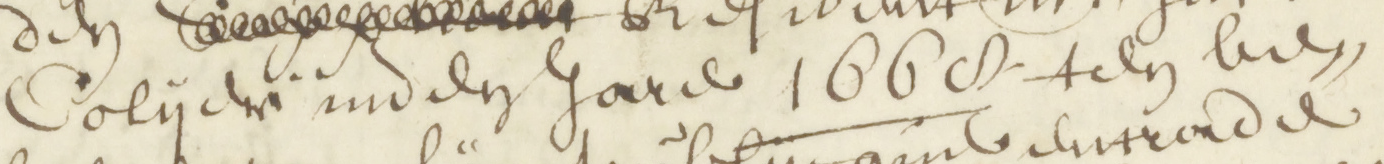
Colijer inden jare 1668 ten be,
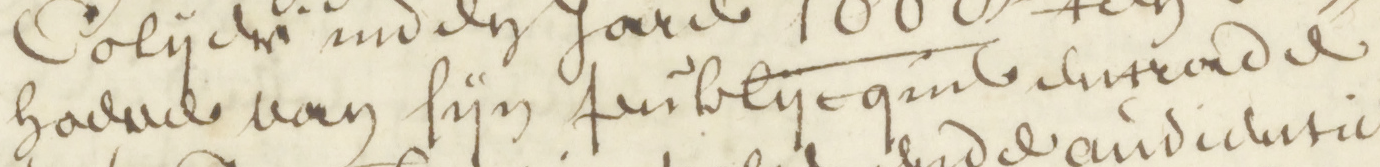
hoeve van sijn publijcque entrade
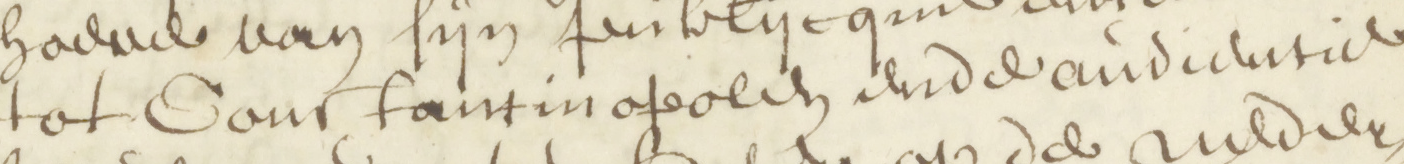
tot Constantinopolen ende audientie
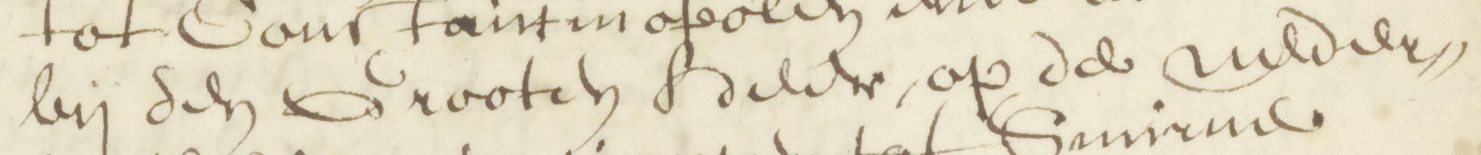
bij den Grooten Heer, op de Neder„
